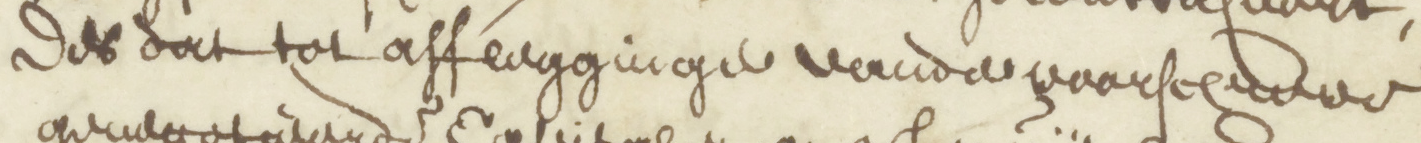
Des dat tot afflegginge vande voorschreve —
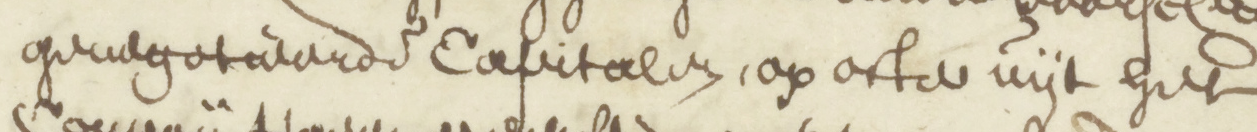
genegotieerde Capitalen, op ofte uijt het
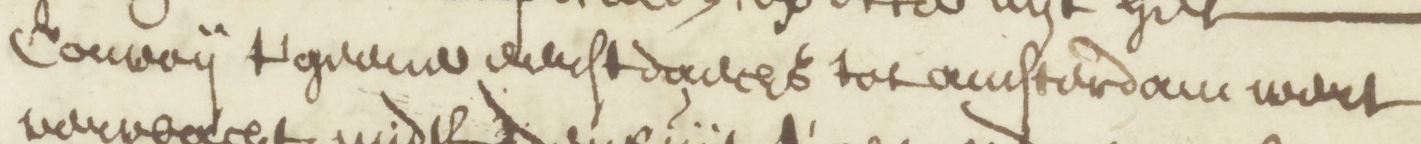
Convoij t'geene eerstdaechs tot amsterdam wert
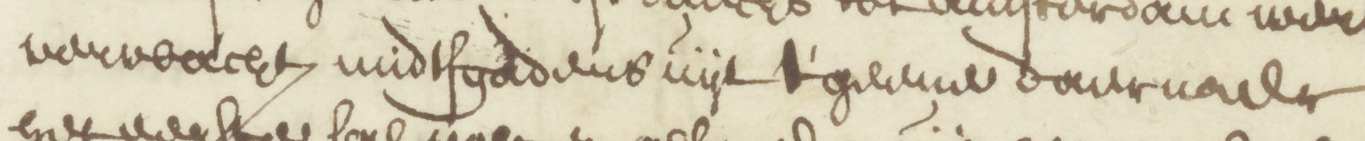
verwacht midtsgaders uijt t'geene daernaer
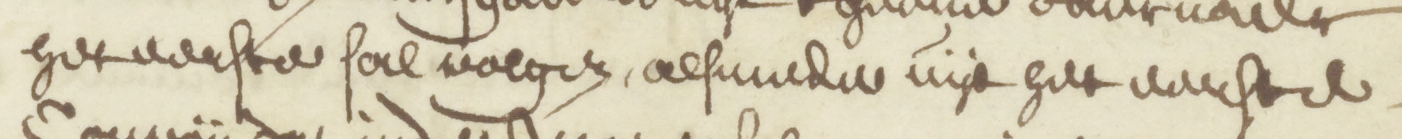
het eerste sal volgen, alsmede uijt het eerste —
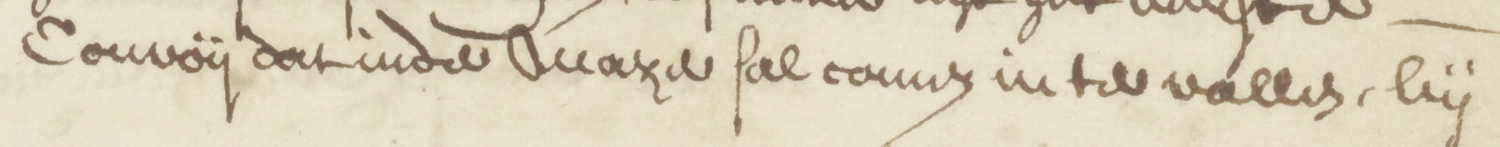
Convoij dat inde Maze sal comen in te vallen, bij
